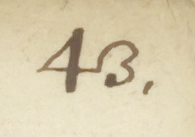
43.
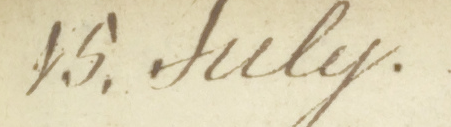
15. July.
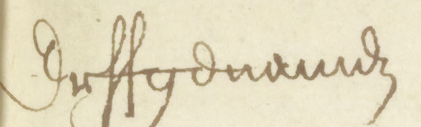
Erffgenamen
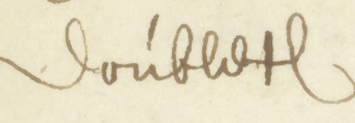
Doubleth
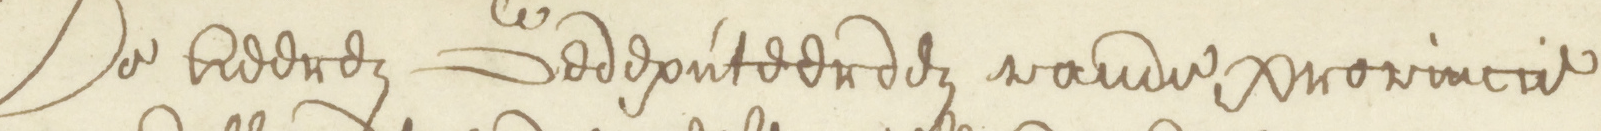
De heeren Gedeputeerden vande Provincie
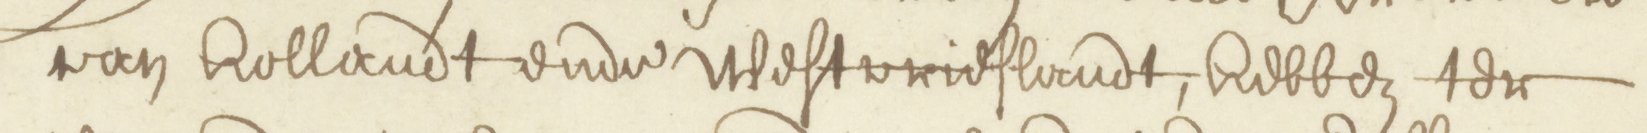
van Hollandt ende Westvrieslandt, hebben ter
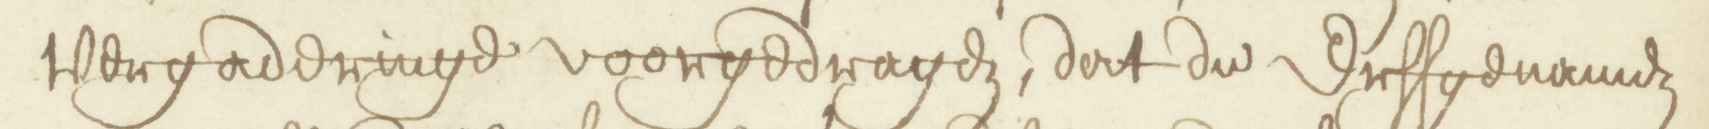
Vergaderinge voorgedragen, dat de Erffgenamen
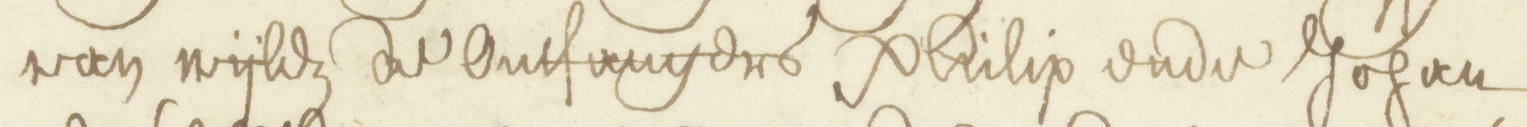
van wijlen de Ontfangers Philip ende Johan
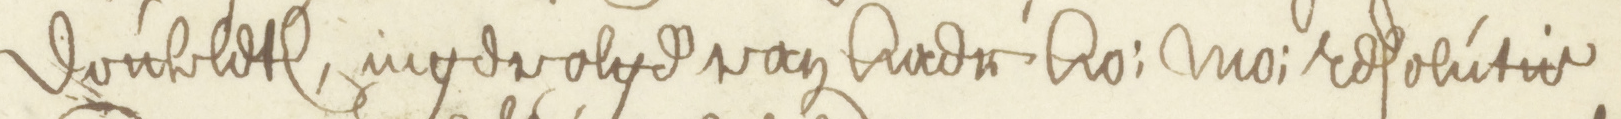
Doubleth, ingevolge van haer Ho:Mo: resolutie
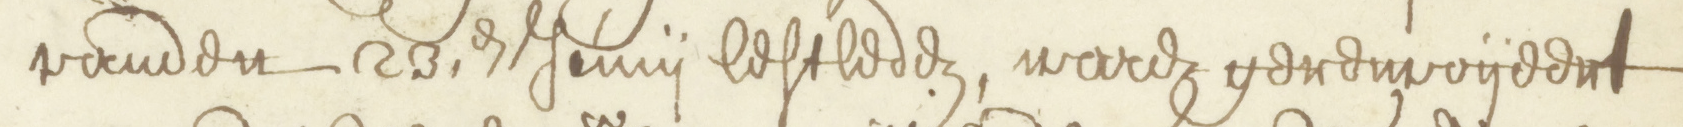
vanden 23en. Junij lestleden, waren gerenvoijeert
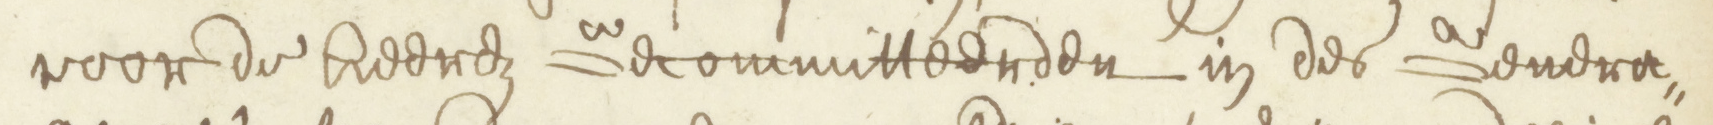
voor de heeren Gecommitteerden in des Genera„
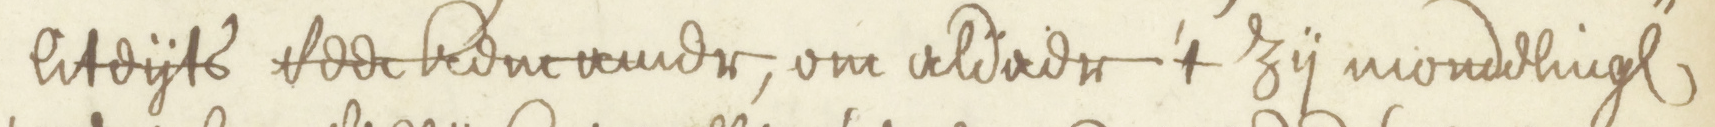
liteijts Reeckencamer, om aldaer 't zij mondelingh
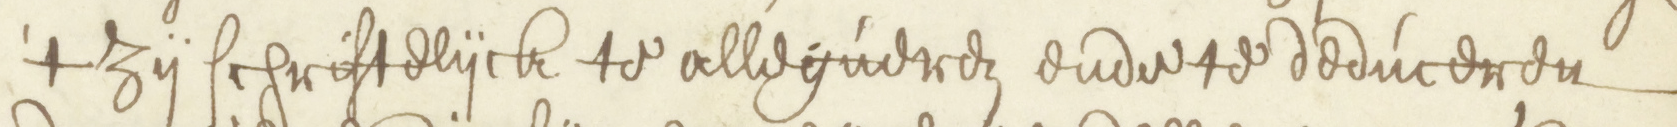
‛t zij schriftelijck te allegueren ende te deduceren,
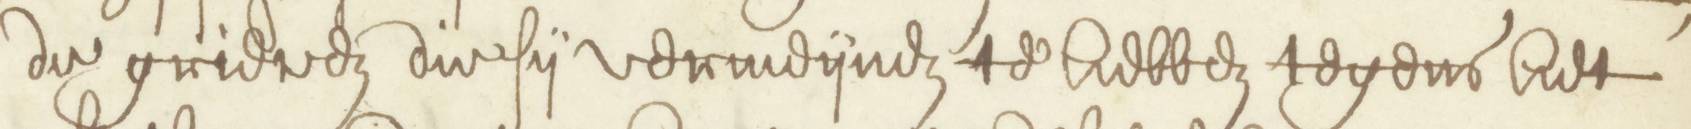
de grieven die sij vermeijnen te hebben tegens het
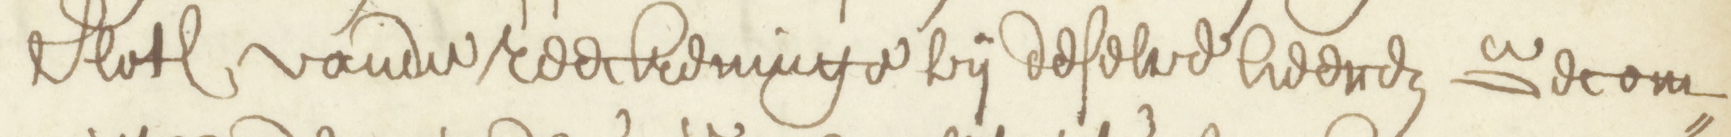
Sloth vande reeckeninge bij deselve heeren Gecom„
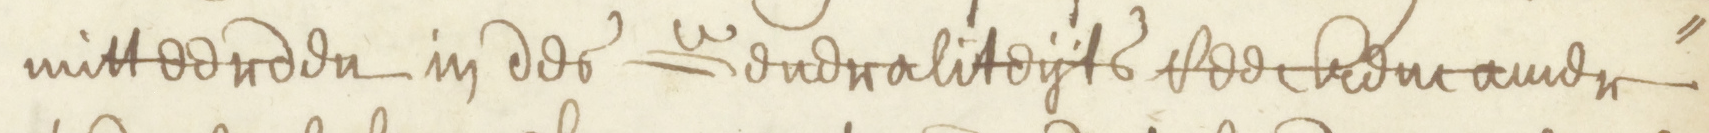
mitteerden in des Generaliteijts Reeckencamer
